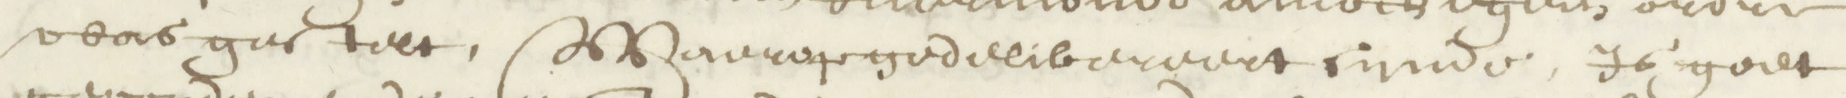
was gestelt. Waerop gedelibereert synde, Is goet
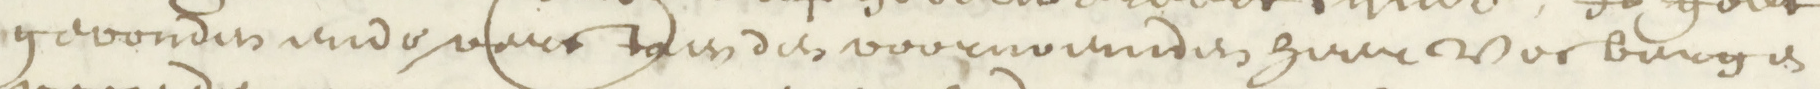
gevonden ende verstaen den voornoemden heer Vosbergen
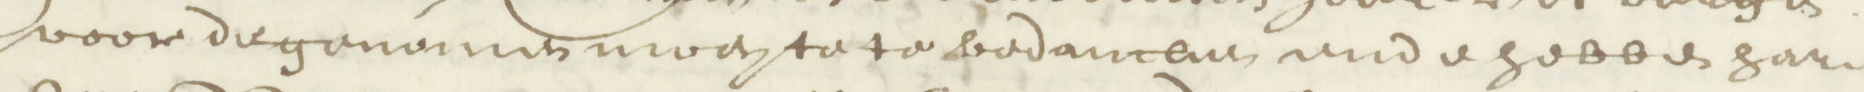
voor de genomen moeyte te bedancken ende hebben hare
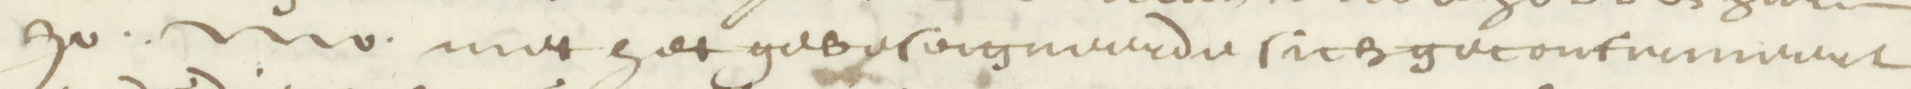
Ho:Mo: met het gebesoigneerde sich geconfirmeert
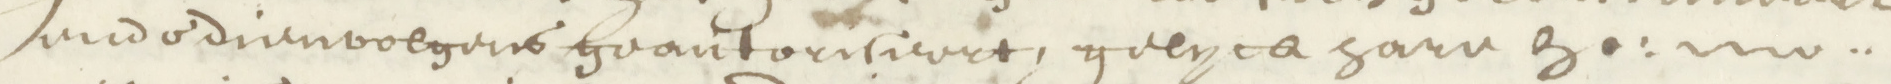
ende dienvolgens geautoriseert, gelyck hare Ho:Mo:
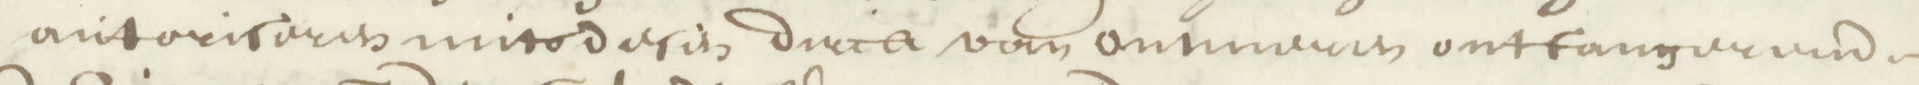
autoriseren mits desen dirck van ommeren ontfanger ende
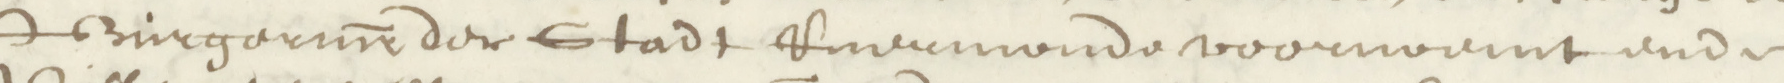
Burgermr der Stadt Ruermonde voornoemt ende
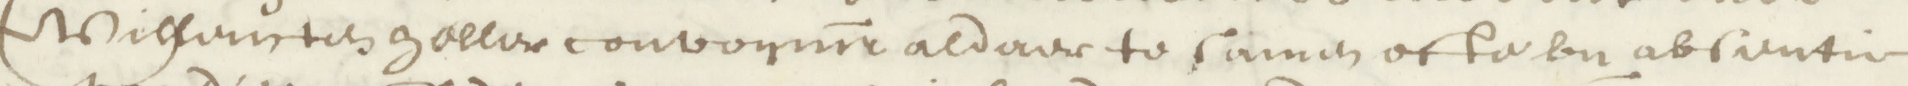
Willem ten heller convoymr aldaer te samen ofte by absentie
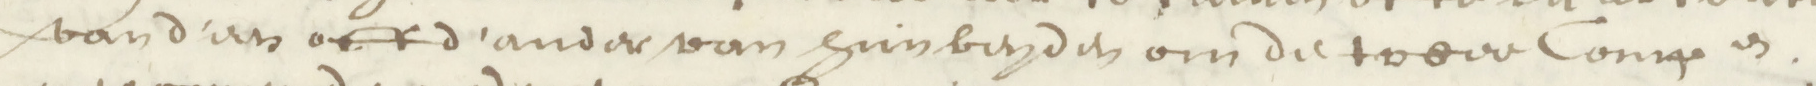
van d'en off d'ander van hun beyden om de twee Compen.
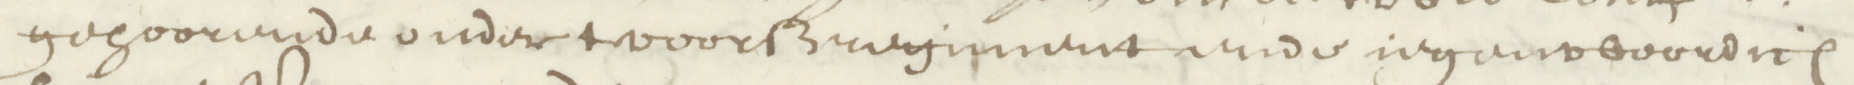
gehoorende onder tvoors regiment ende iegenwoordich
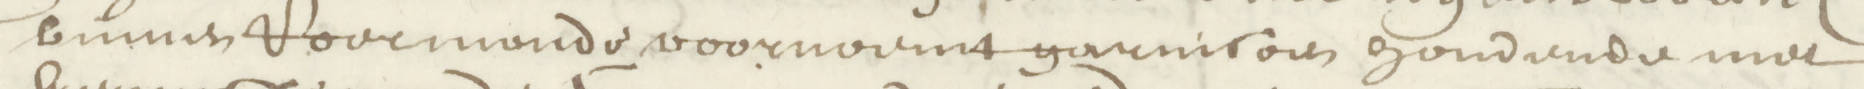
binnen Roermonde voornoemt garnisoen houdende met
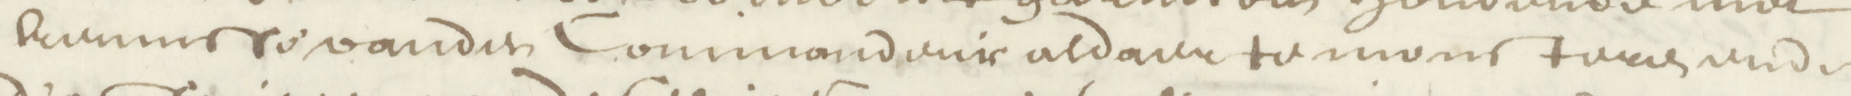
kennisse vanden Commandeur aldaer te monsteren ende
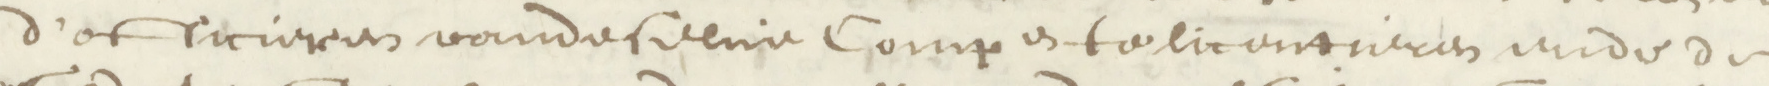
d'officieren vandeselue Compen te licentieren ende de
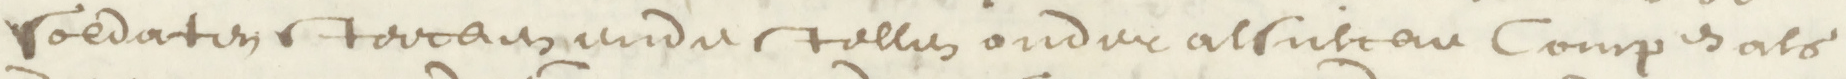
soldaten steecken ende stellen onder alsulcke Compen als
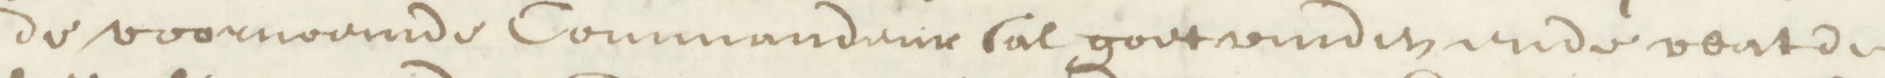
de voornoemde Commandeur sal goetvinden ende wat de
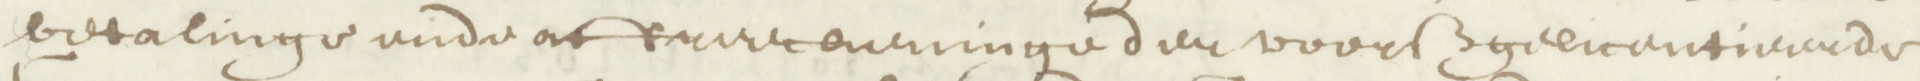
betalinge ende affreeckeninge der voors gelicentieerde
